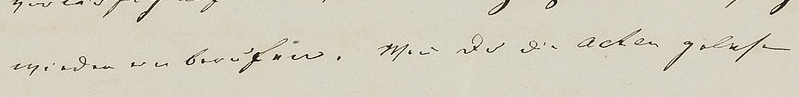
wieder einberufen. Wenn Du die Acten gelesen
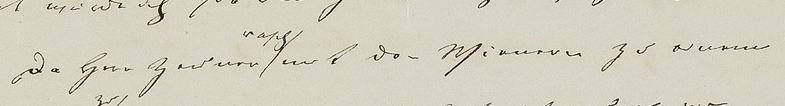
Da Herr Zeunerrasch mit den Wienern zu einem
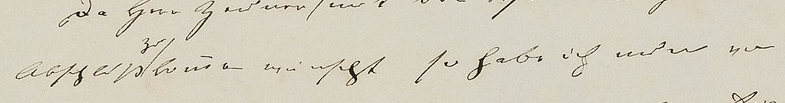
Abschluß zu kommen wünscht so habe ich nun von
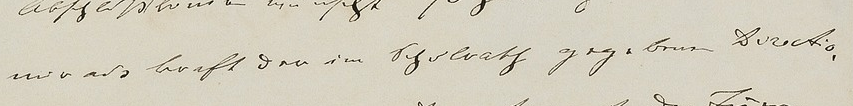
mir aus kraft der im Schulrath gegebenen Directio-
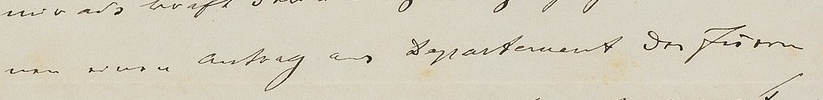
nen einen Antrag ans Departement des Innern
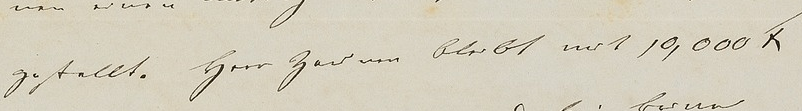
gestellt. Herr Zeuner bleibt mit 10,000 Fr
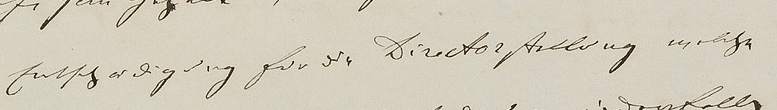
Entschädigung für die Directorstellung welche
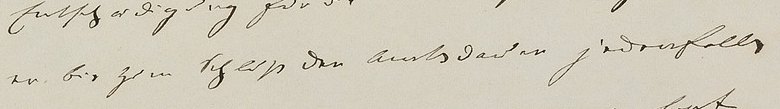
er bis zum Schluß der Amtsdauer jedenfalls
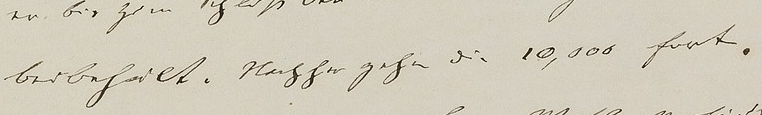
beibehält. Nachher gehen die 10,000 fort.
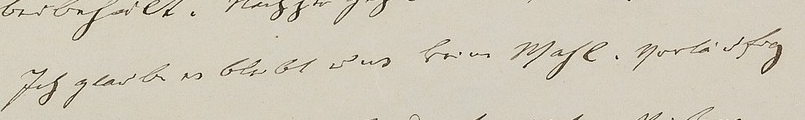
Ich glaube es bleibt uns keine Wahl. Vorläufig
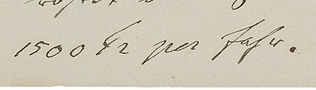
1500 Fr per Jahr.
